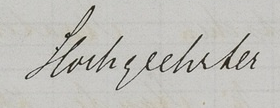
Hochgeehrter
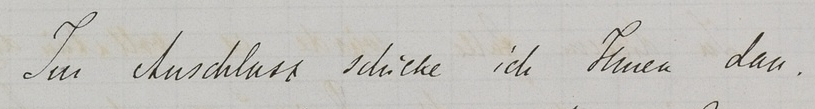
Im Anschluss schicke ich Ihnen dan-
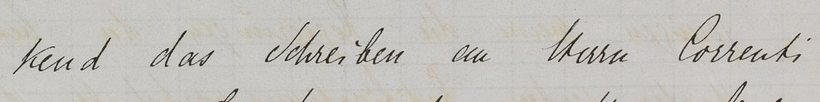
kend das Schreiben an Herrn Correnti
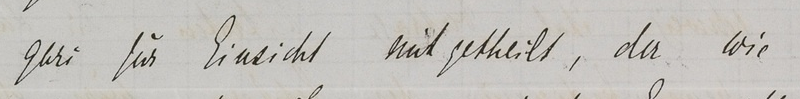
gari zur Einsicht mitgetheilt, der wie
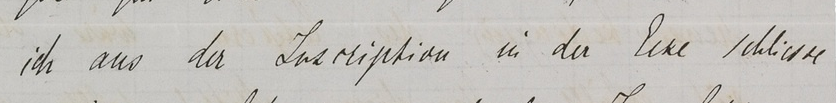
ich aus der Inscription in der Ecke schliesse
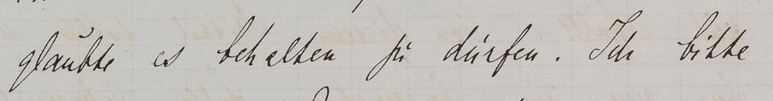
glaubte es behalten zu dürfen. Ich bitte
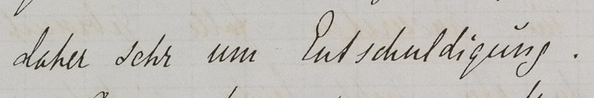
daher sehr um Entschuldigung.
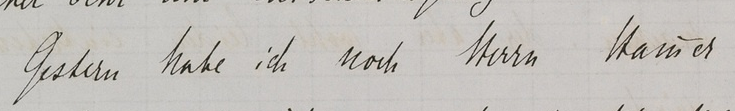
Gestern habe ich noch Herrn Hammer
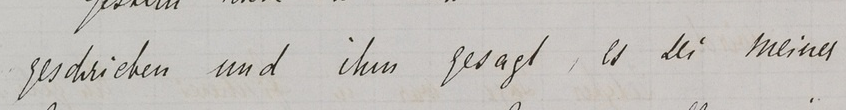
geschrieben und ihm gesagt, es sei meiner
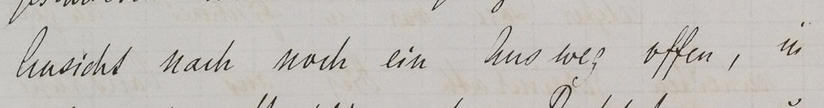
Ansicht nach noch ein Ausweg offen, in-
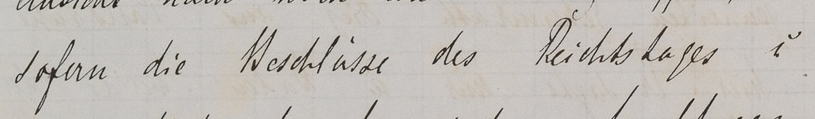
sofern die Beschlüsse des Reichtstages u
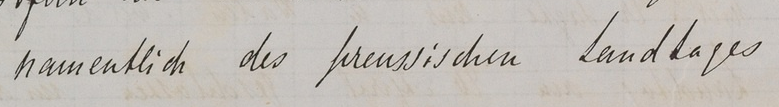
namentlich des preussischen Landtages
